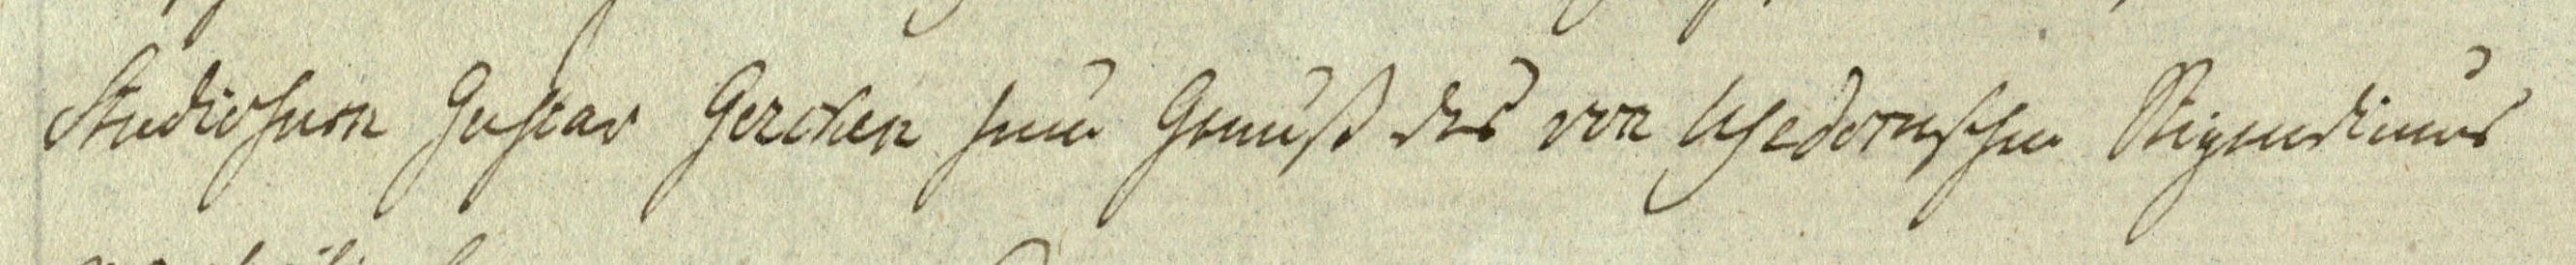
Studiosum Gustav Gercken zum Genuß des von Usedomschen Stipendiums
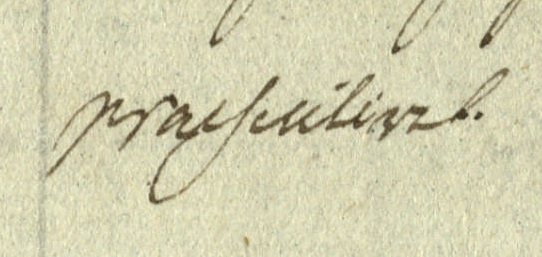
praesentiret.
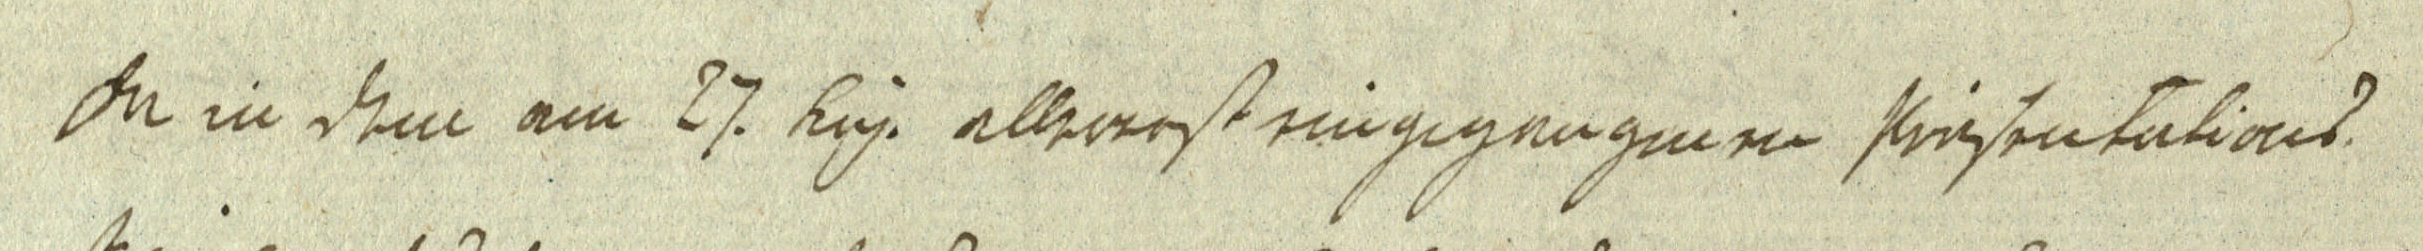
Da in dem am 27. huj. allererst eingegangenen Präsentations
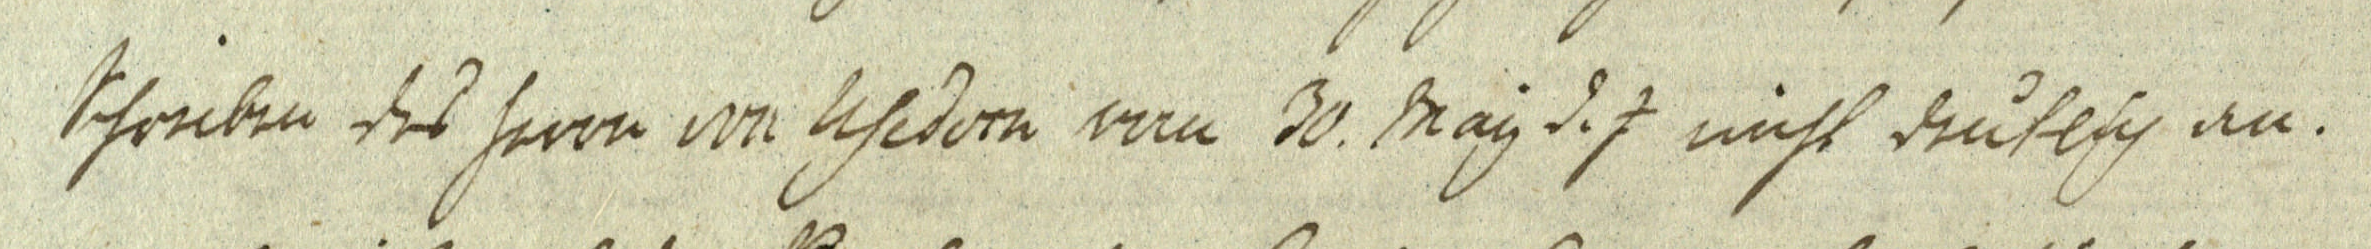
Schreiben des Herrn von Usedom vom 30. Maÿ d. J. nicht deutlich an¬
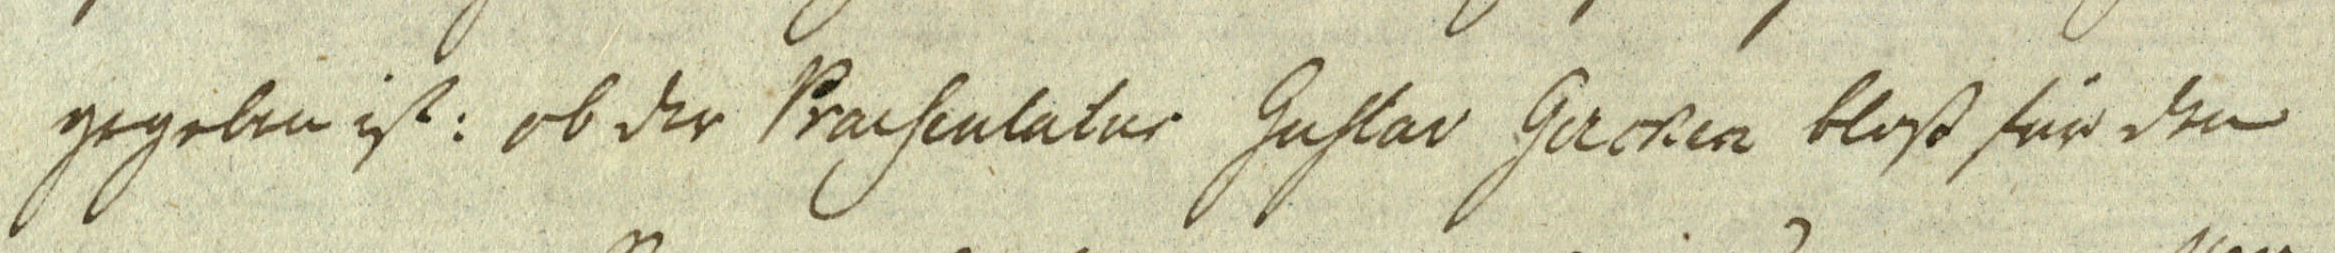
gegeben ist: ob der Praesentatus Gustav Gercken bloß für den
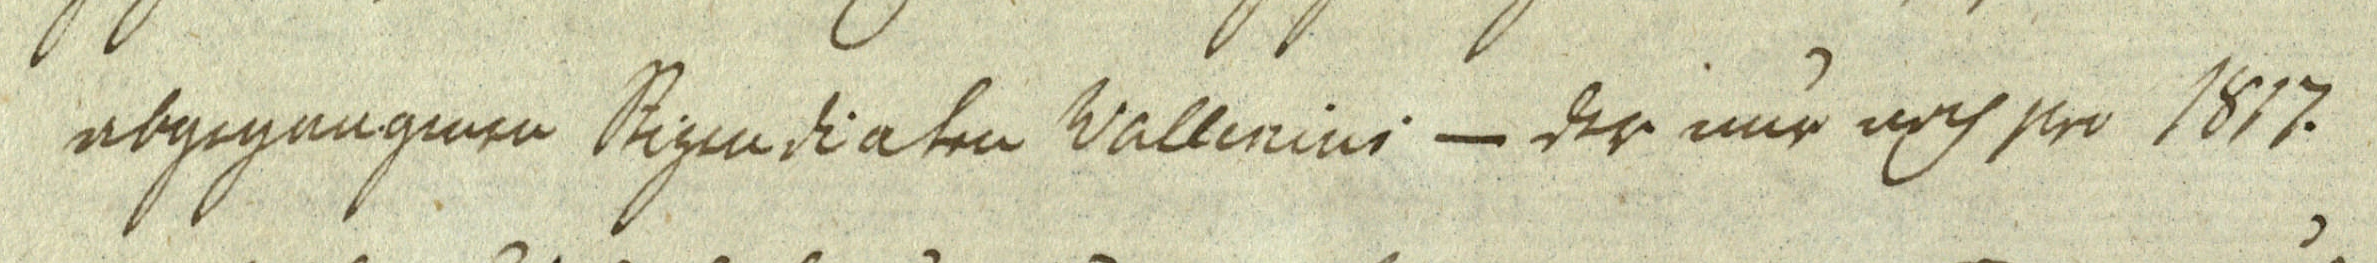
abgegangenen Stipendiaten Wallenius - der nur noch pro 1817.
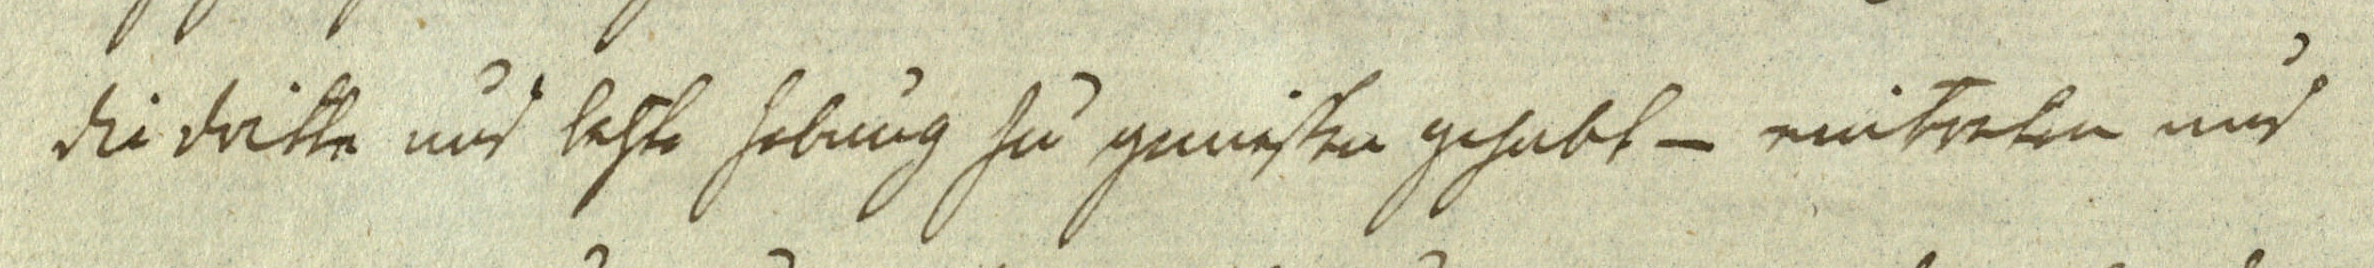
die dritte und letzte Hebung zu geniessen gehabt - eintreten und
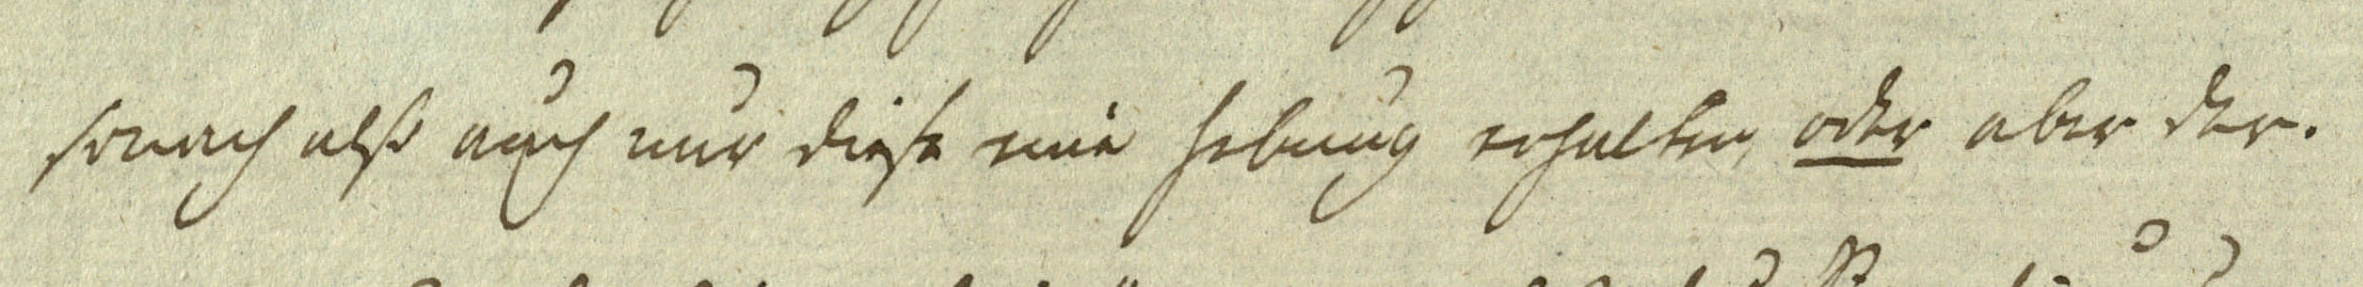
sonach als auch nur diese eine Hebung erhalten oder aber der¬
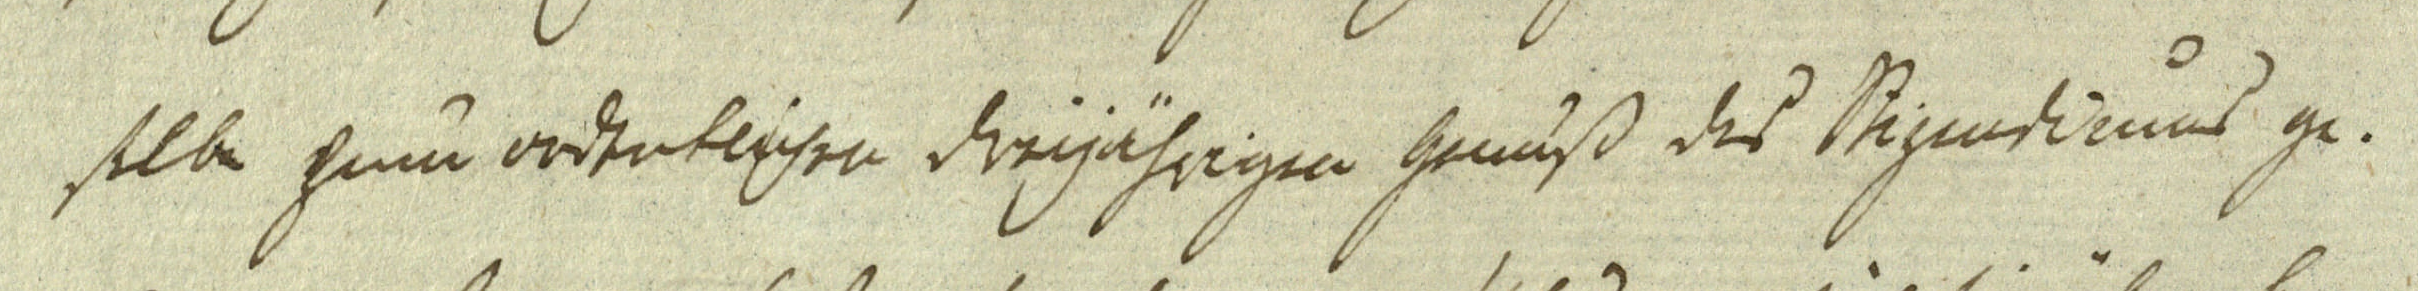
selbe zum ordentlichen dreijährigen Genuß des Stipendiums ge¬
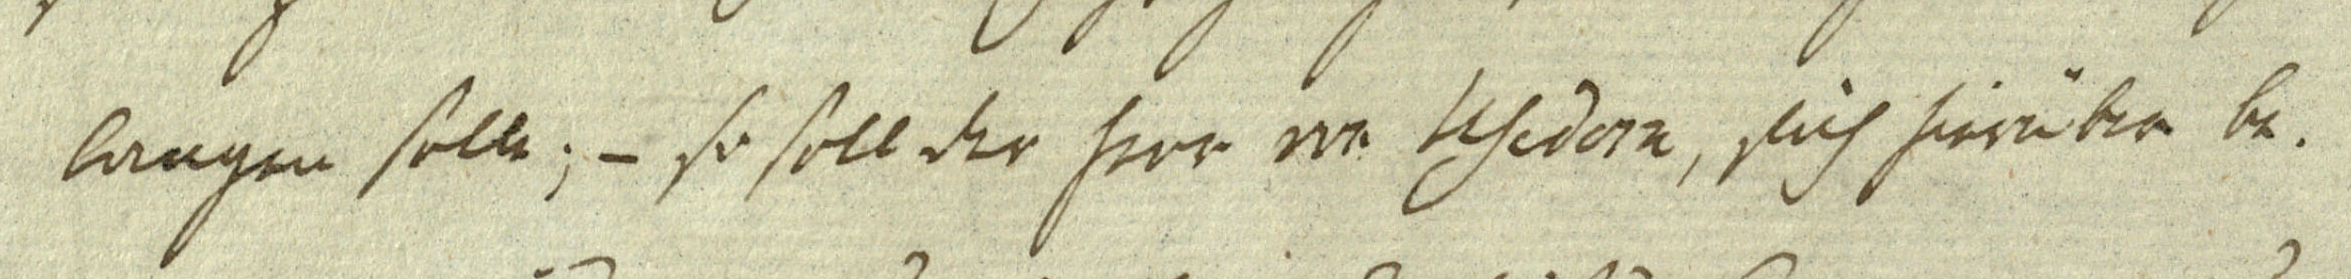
langen solle; - so soll der Herr von Usedom, sich hierüber be¬
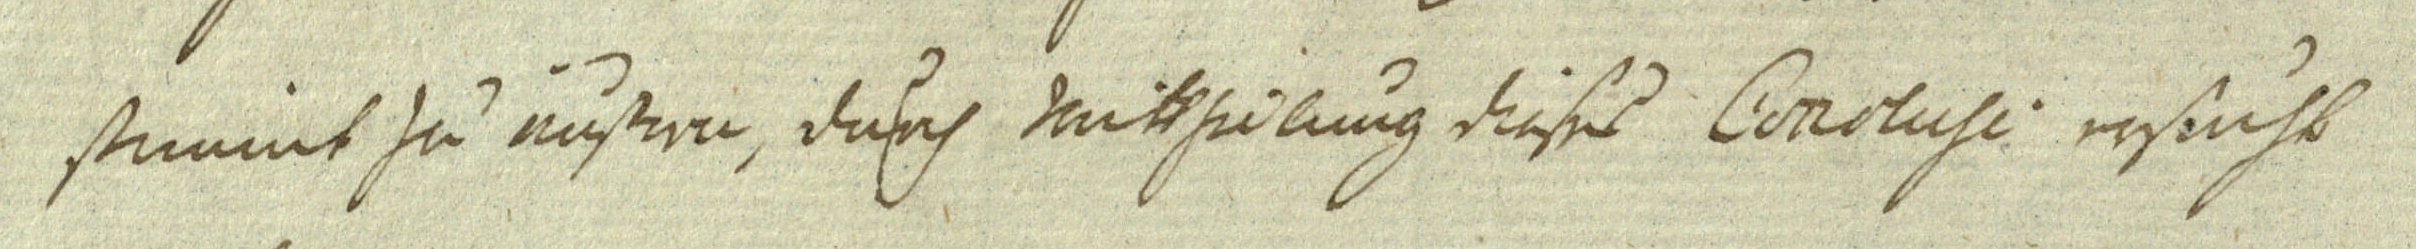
stimmt zu äußern, durch Mittheilung dieses Conclusi ersucht
